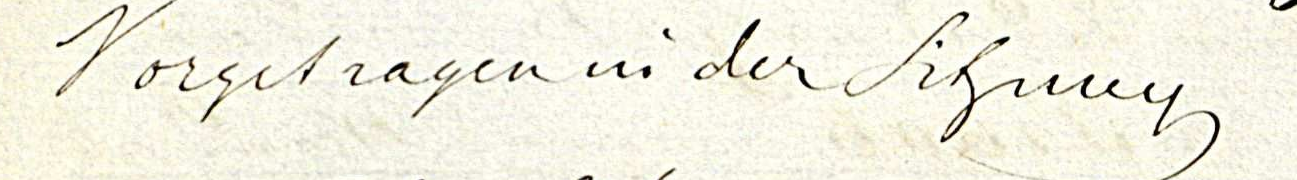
Vorgetragen in der Sitzung
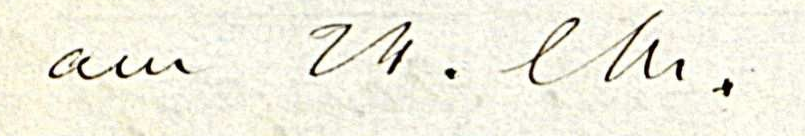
am 24. Mr.
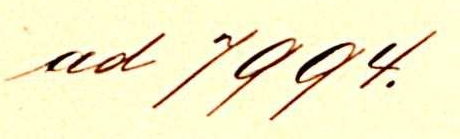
ad 7994.
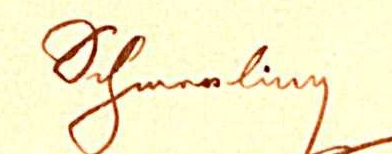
Schmerling
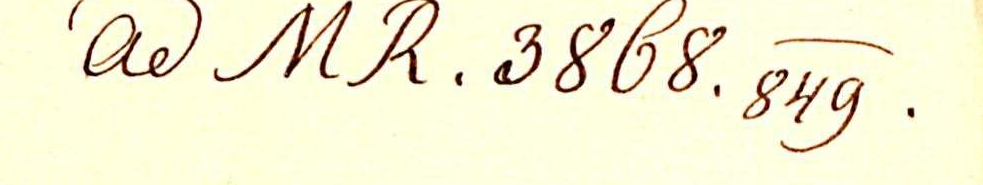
Ad MR. 3868. 849.
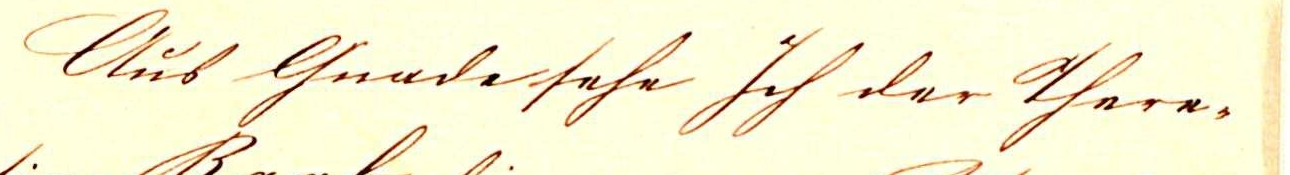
Aus Gnade sehe Ich der There¬
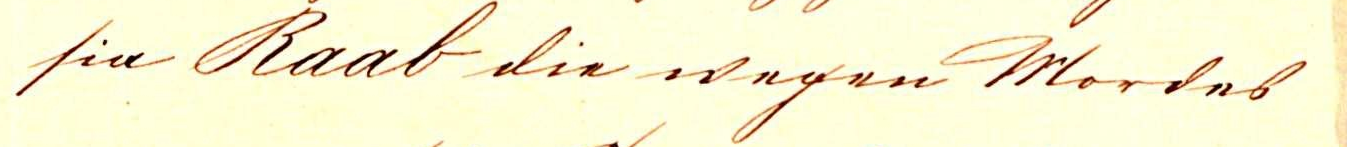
sia Raab die wegen Mordes
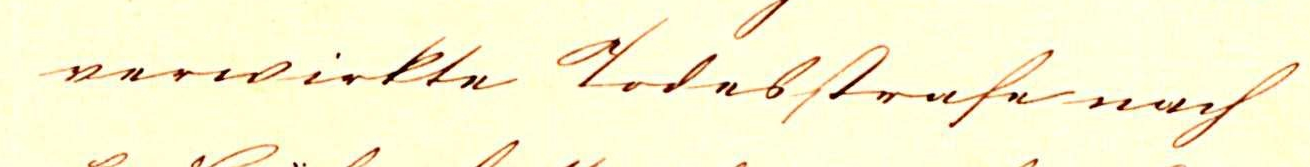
verwirkte Todesstrafe nach
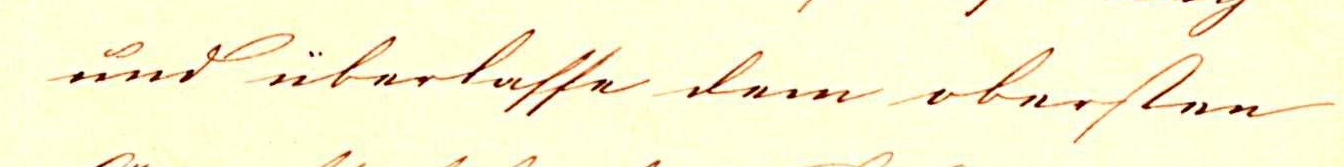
und überlasse dem Obersten
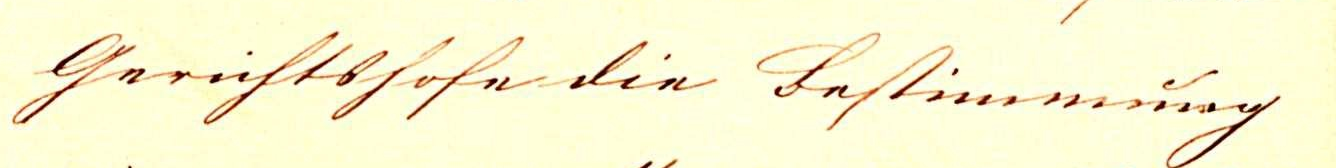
Gerichtshofe die Bestimmung
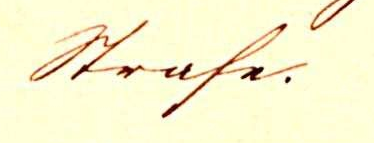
Strafe.
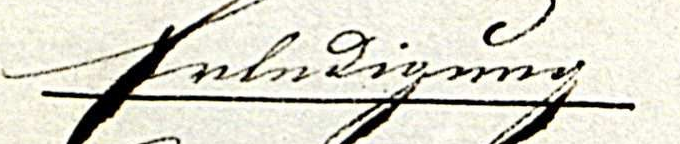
Erledigung
